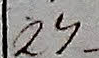27
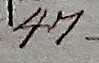47
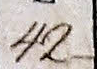42
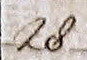28
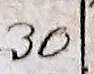30
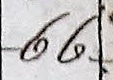66
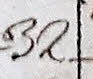32
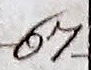67
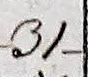31
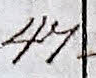47
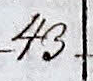43
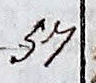47
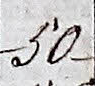50
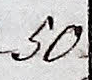50
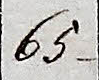65
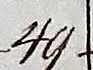49
